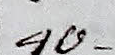40
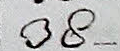38
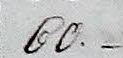60.
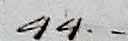44.
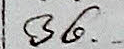36.
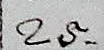25
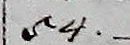54.
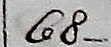68
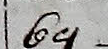64
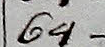64
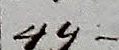49
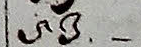53.
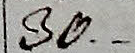30.
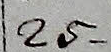25
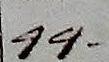44
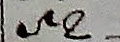52
